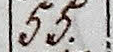55.
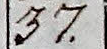37.
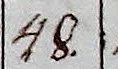48.
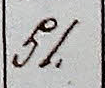51.
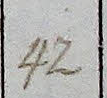42
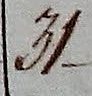31
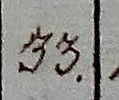33.
